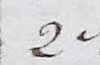2
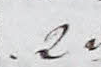2
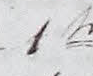1
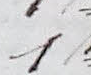1
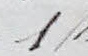1
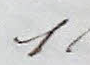1
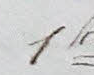1
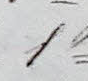1
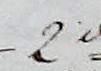2
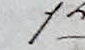1
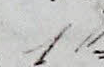1
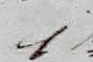1
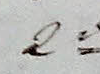2
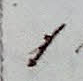1
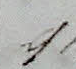1
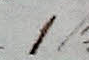1
